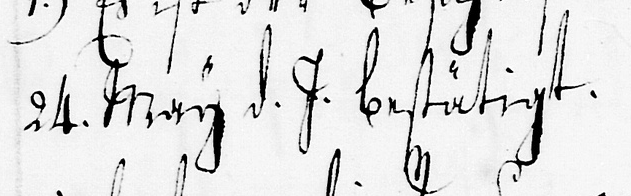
24. May d. J. bestätigt.
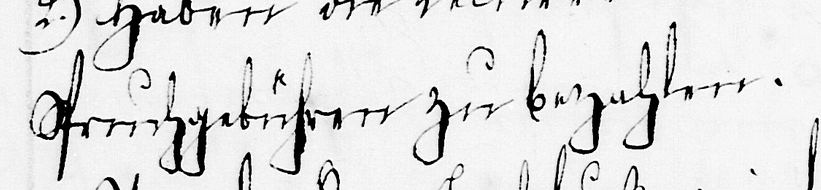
Spruchgebühren zu bezahlen.
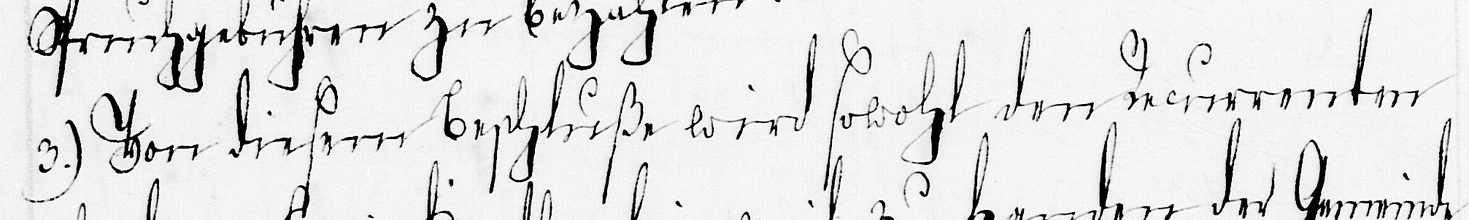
3.) Von diesem Beschluße wird sowohl den Recurrenten
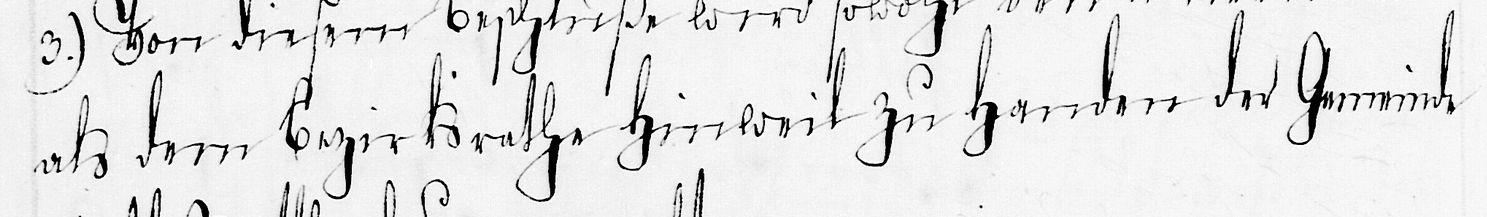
als dem Bezirksrathe Hinweil zu Handen der Gemeinde
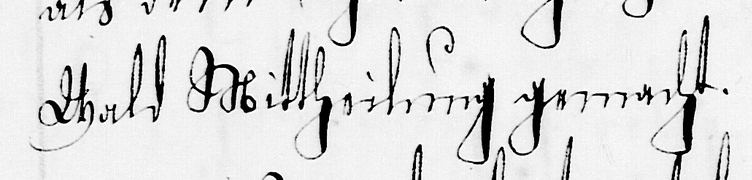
Wald Mittheilung gemacht.
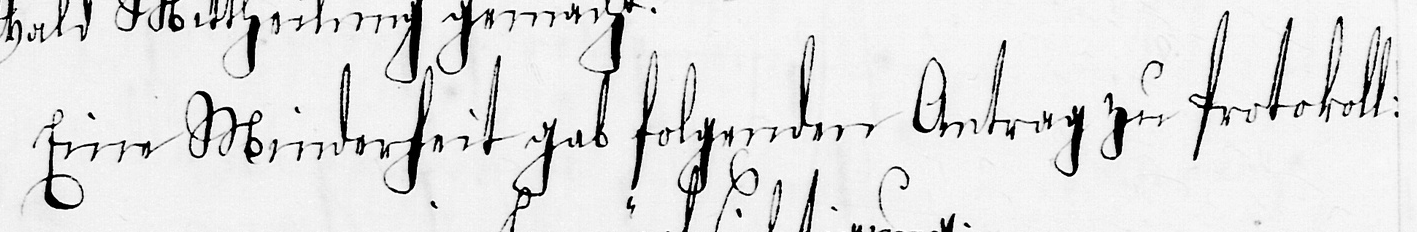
Eine Minderheit gab folgenden Antrag zu Protokoll:
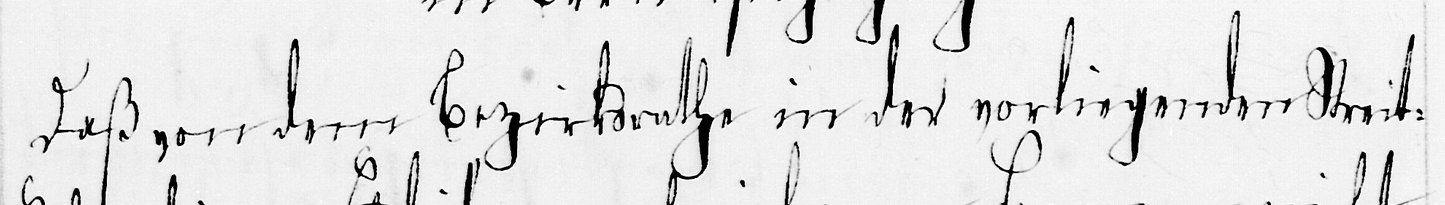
Daß von dem Bezirksrathe in der vorliegenden Streit¬
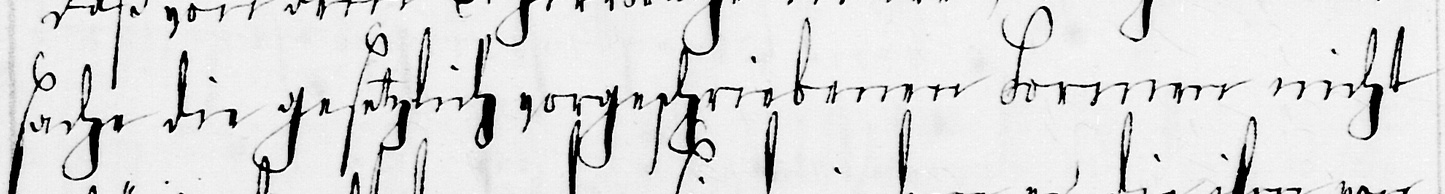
sache die gesetzlich vorgeschriebenen Formen nicht
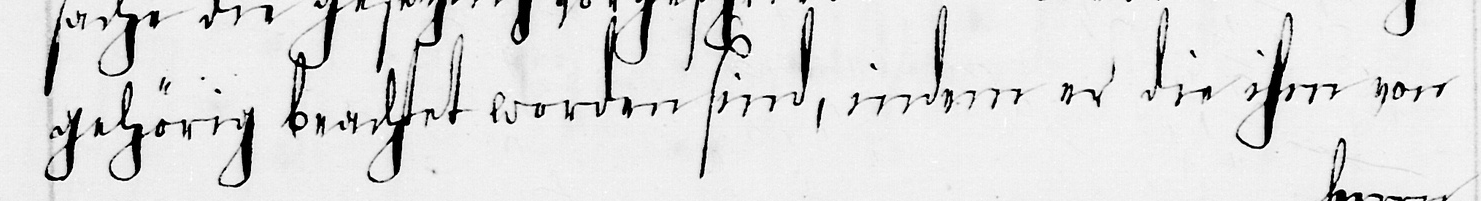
gehörig beachtet worden sind, indem er die ihm von
